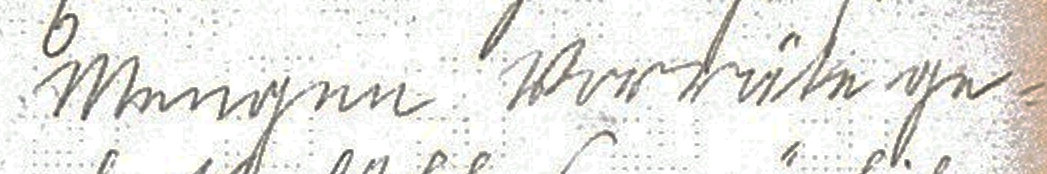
Mengen Vorräte ge-
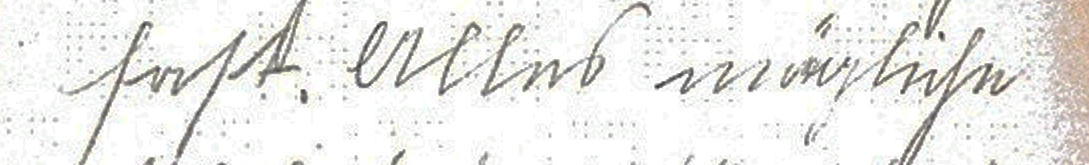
fasst. Alles mögliche
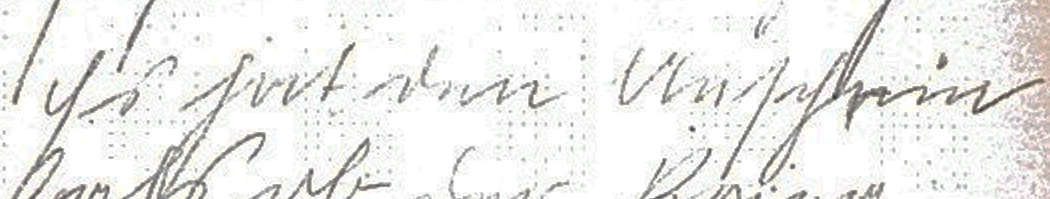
Es hat den Anschein
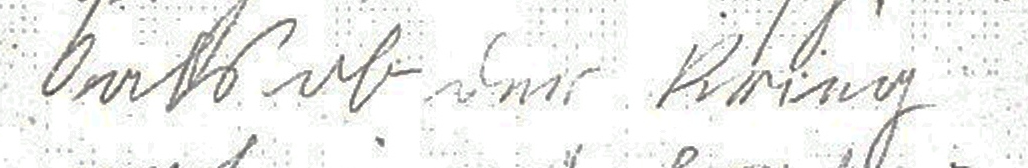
als ob der Krieg
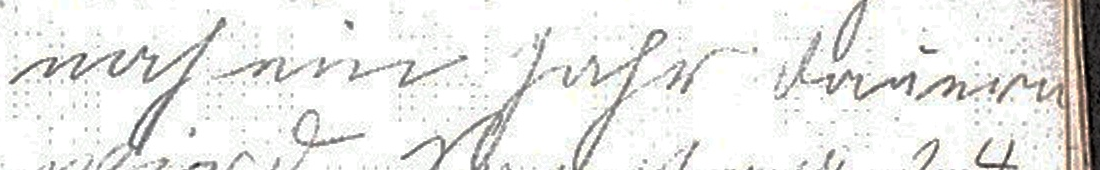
noch ein Jahr dauern
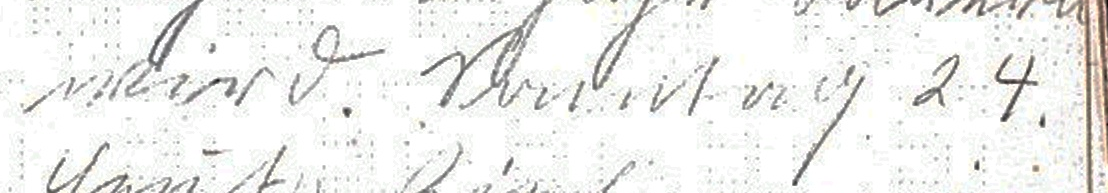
wird. Dienstag 24.
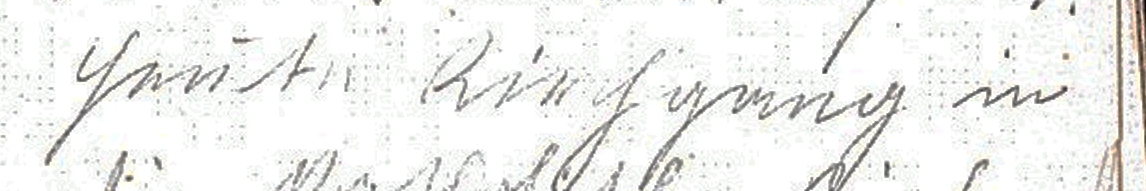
Heute Kirchgang in
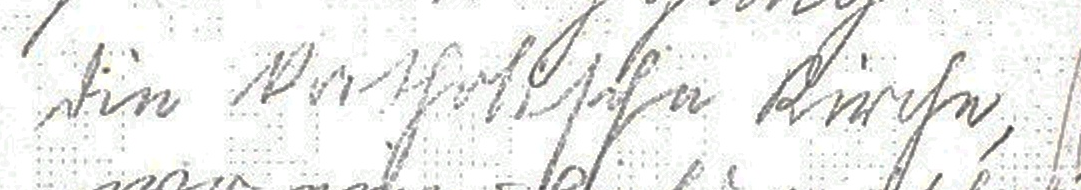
die katholische Kirche
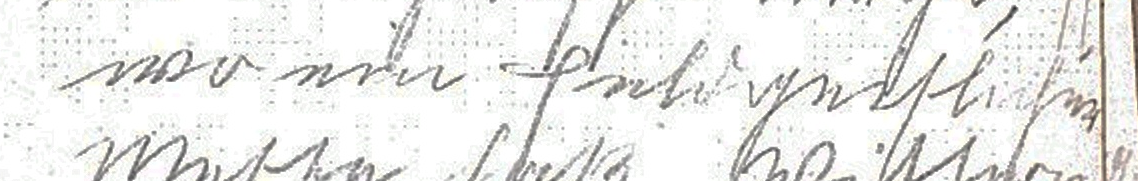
wo ein Geistlicher
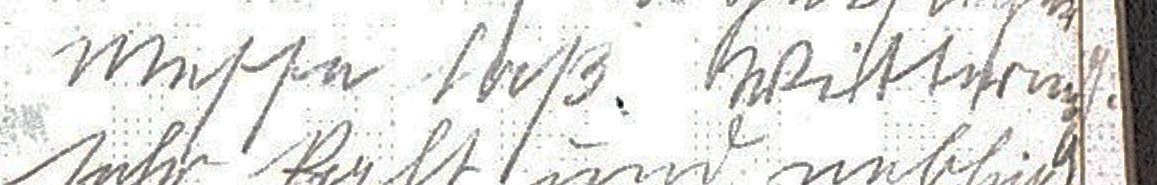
Messe laß. Witterung
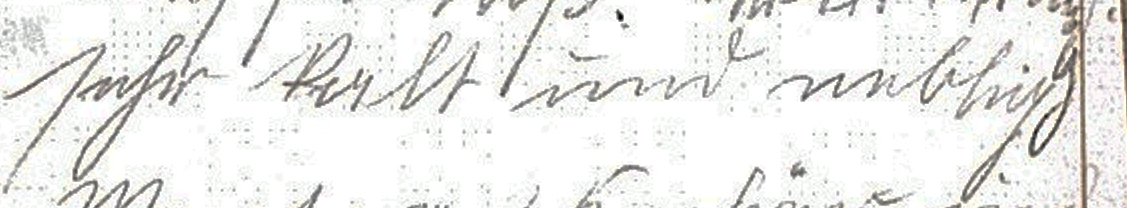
sehr kalt und neblig
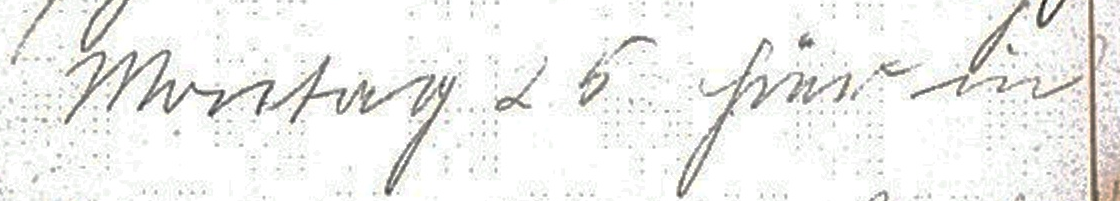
Montag 25. hier in
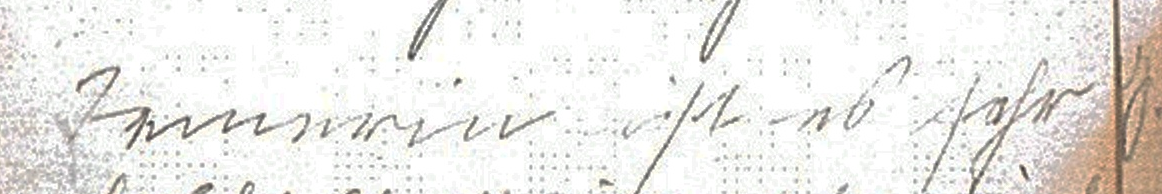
Temerin ist es sehr
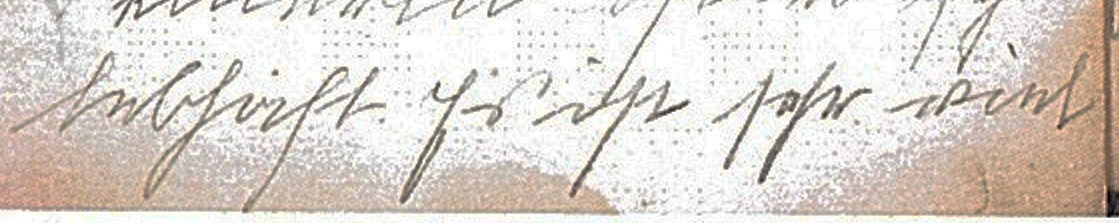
lebhaft es ist sehr viel
